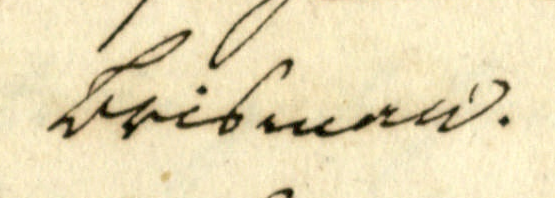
Brisman.
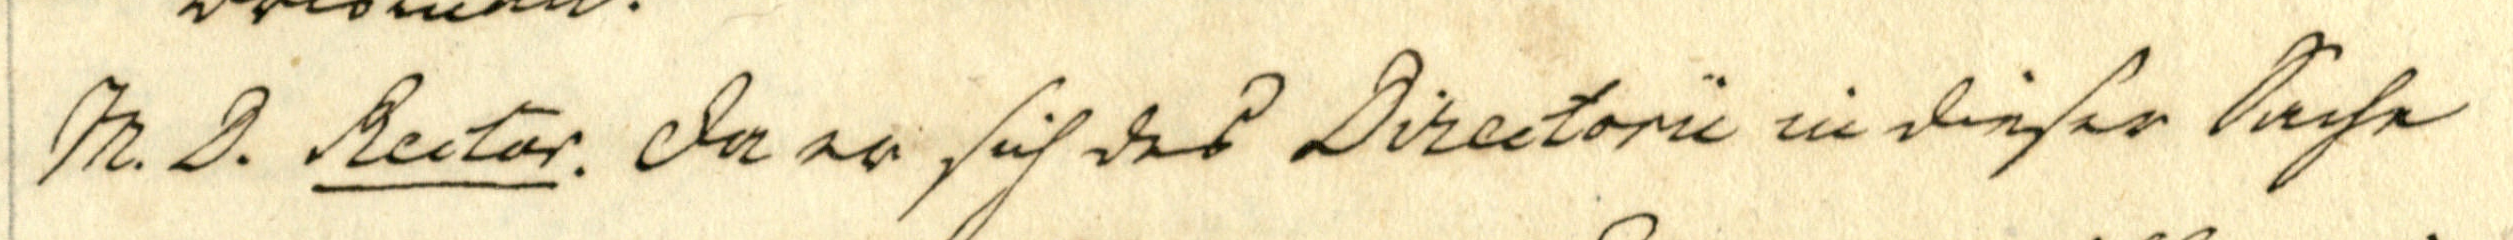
M. D. Rector. Da er sich des Directorii in dieser Sache
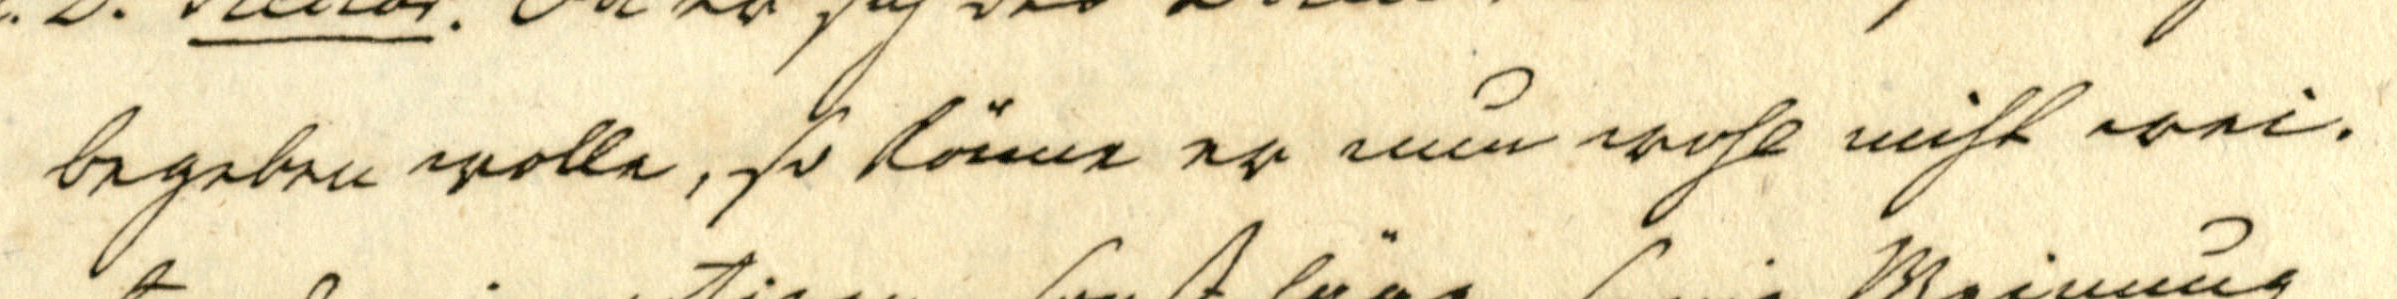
begeben wolle, so könne er nun wohl nicht wei¬
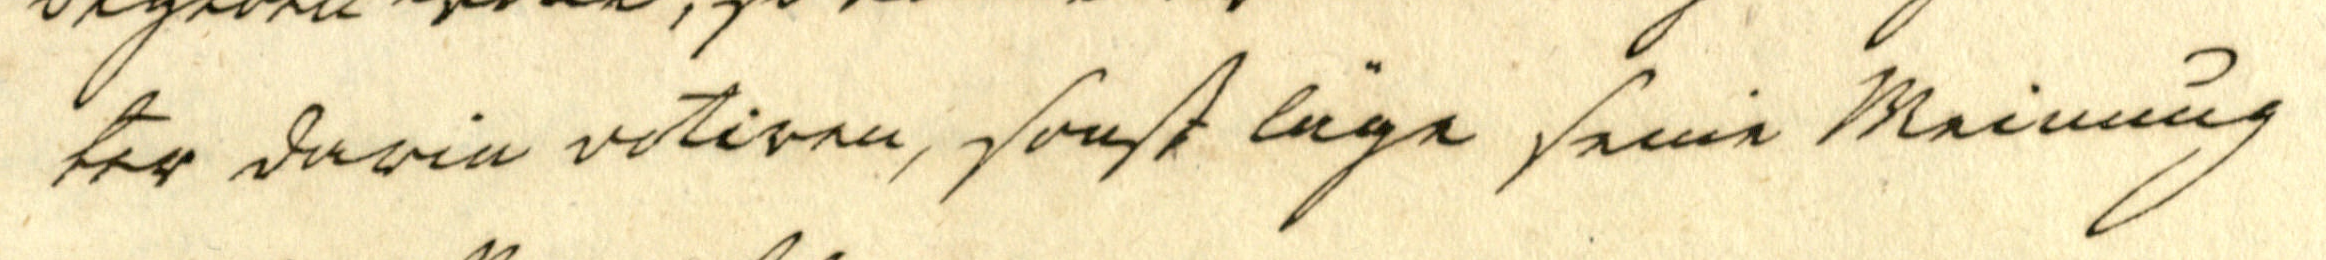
der darin votiren, sonst läge seine Meinung
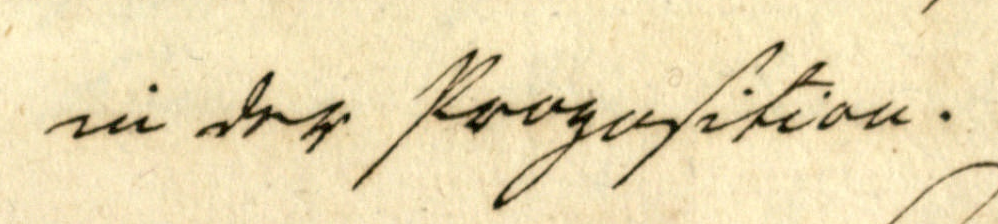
in der Proposition.
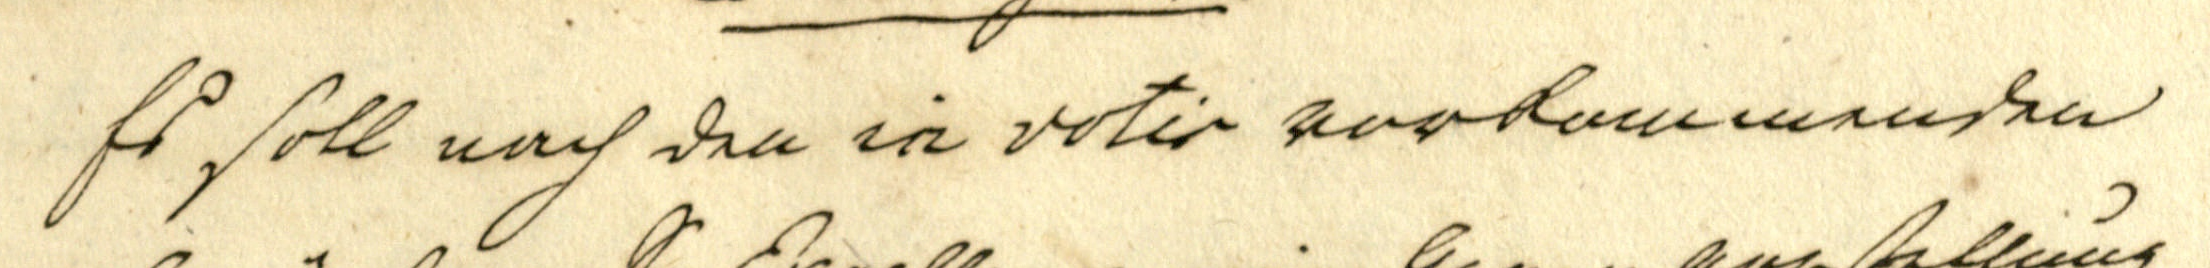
Es soll nach den in votis vorkommenden
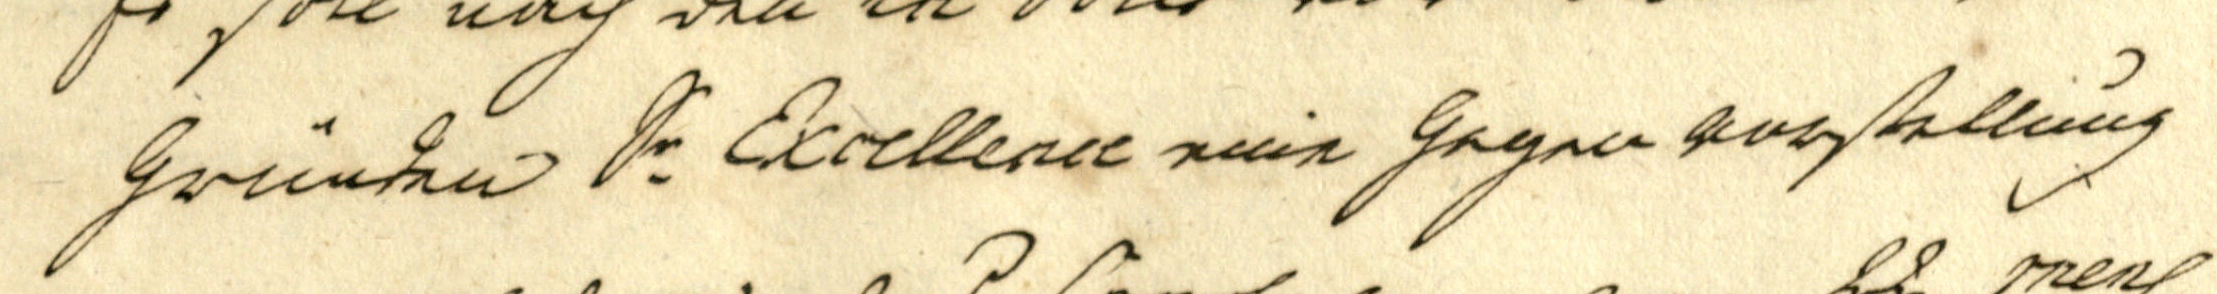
Gründen Sr. Excellence eine Gegen vorstellung
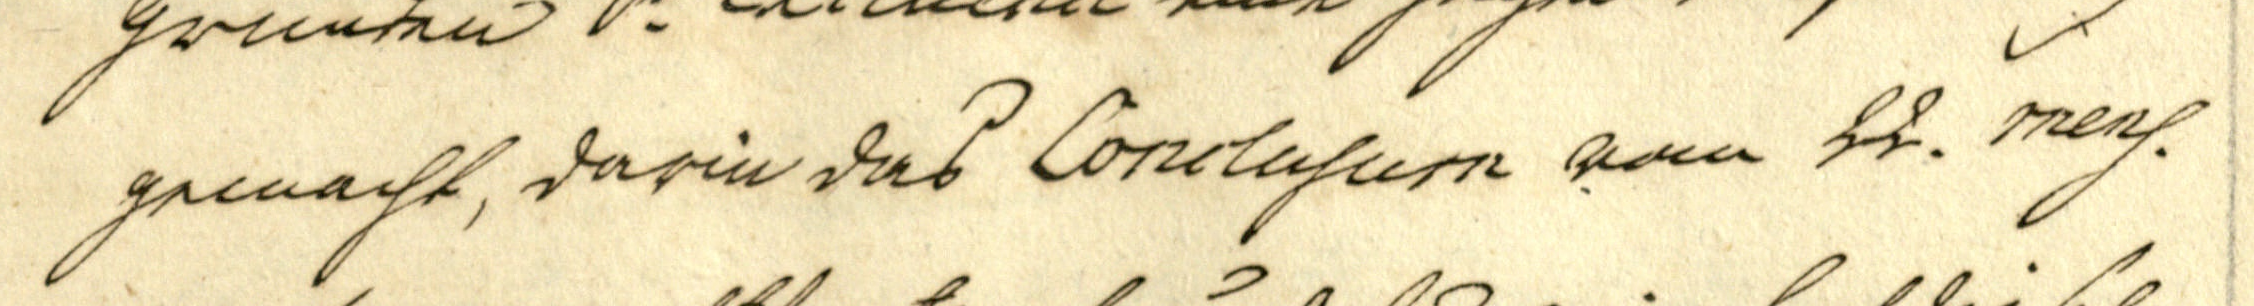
gemacht, darin das Conclusum vom 22. mens.
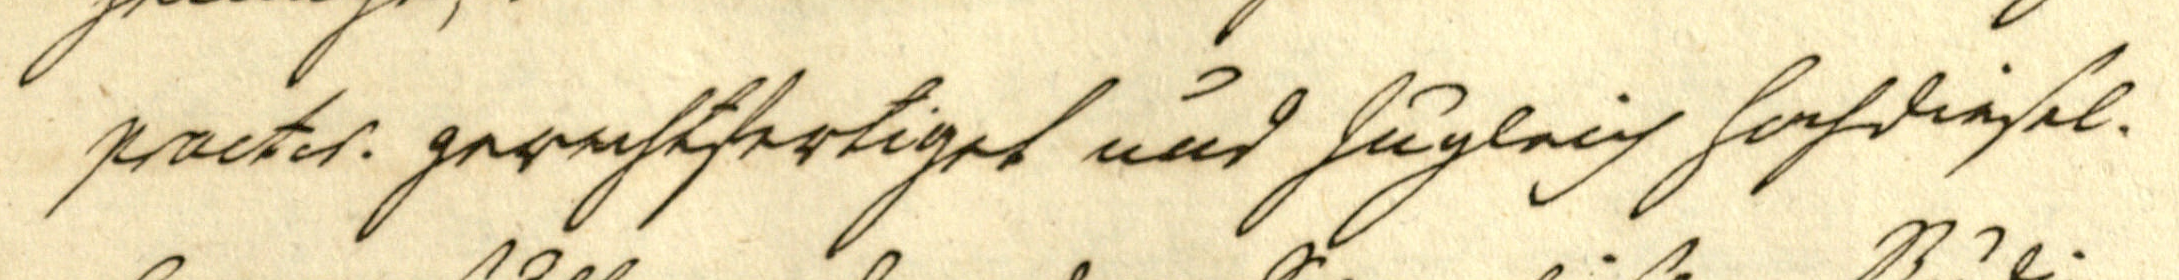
aber gerechtfertiget und zugleich hochdiesel¬
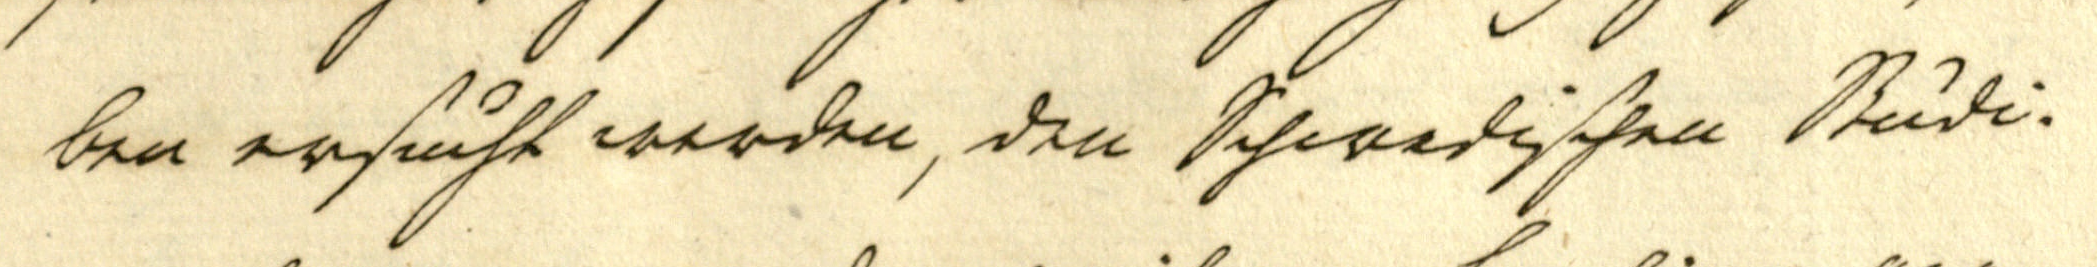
ben ersucht werden, den Schwedischen Studi¬
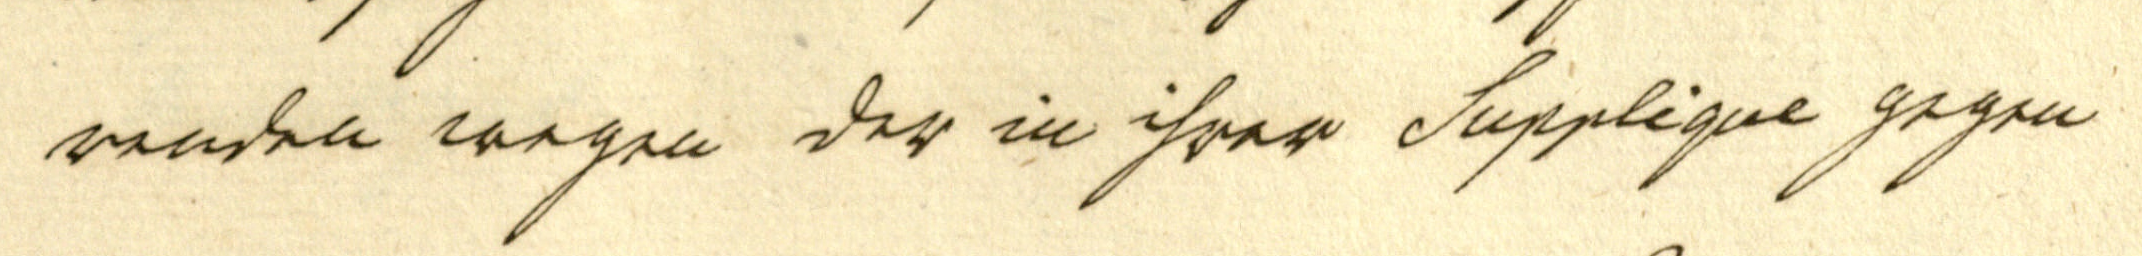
renden wegen der in ihrer Supplique gegen
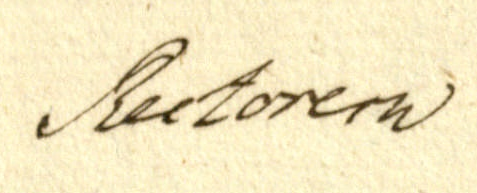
Rectorem
